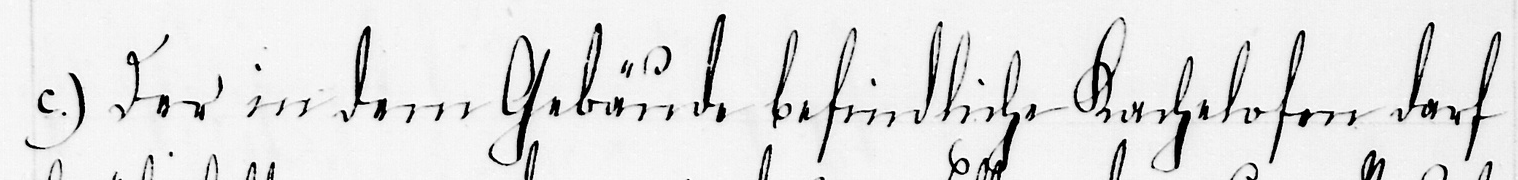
c.) Der in dem Gebäude befindliche Kachelofen darf
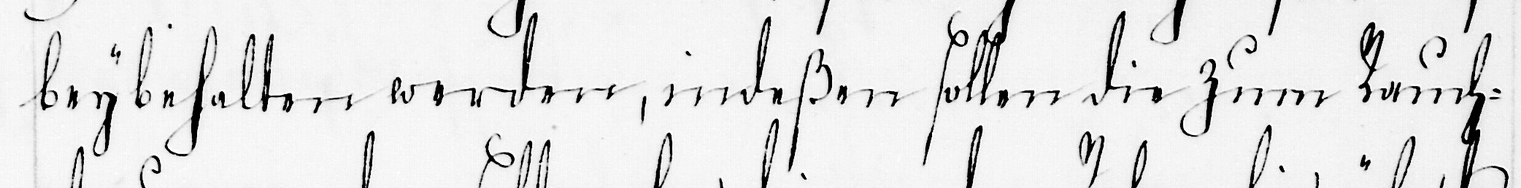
beybehalten werden, indeßen sollen die zum Rauch¬
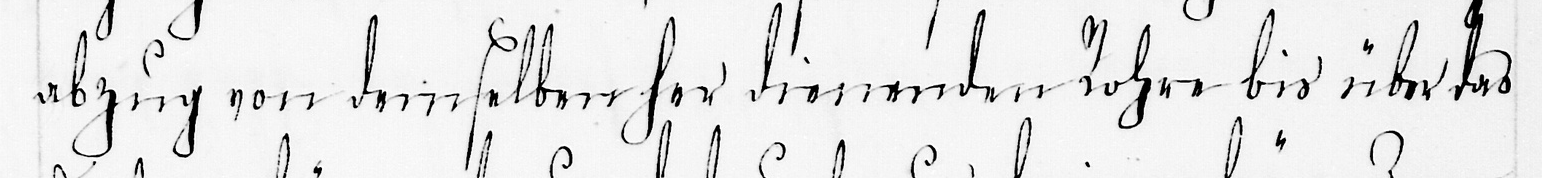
abzug von demselben her dienenden Rohre bis über das
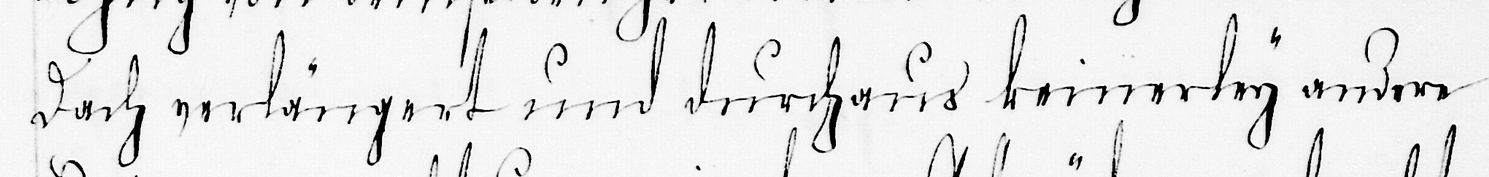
Dach verlängert und durchaus keinerley andere
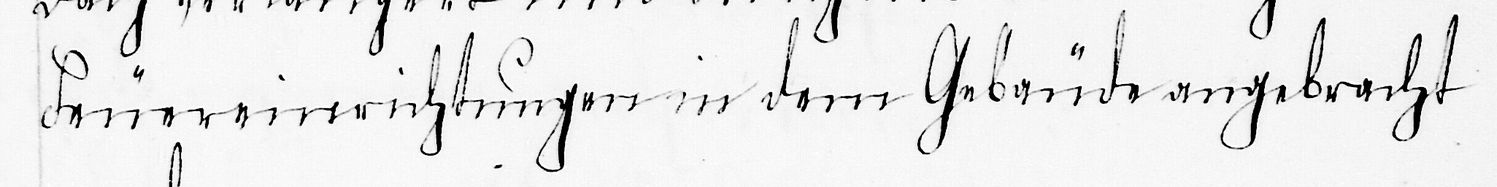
Feuereinrichtungen in dem Gebäude angebracht
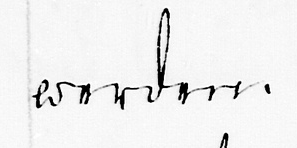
werden.
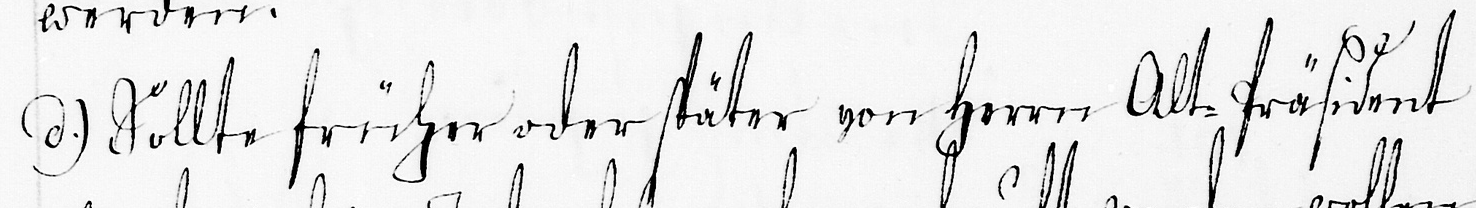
d.) Sollte früher oder später von Herrn Alt-Präsident
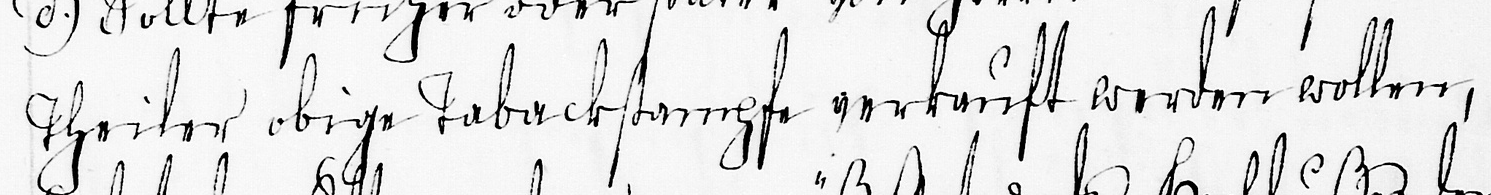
Theiler obige Tabackstampfe verkauft werden wollen,
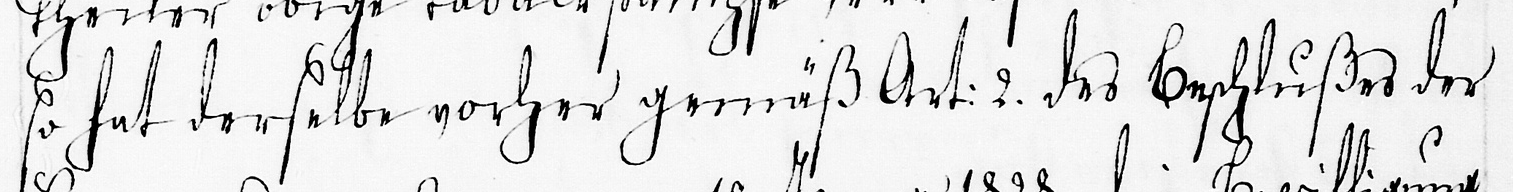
so hat derselbe vorher gemäß Art: 2. des Beschlußes der
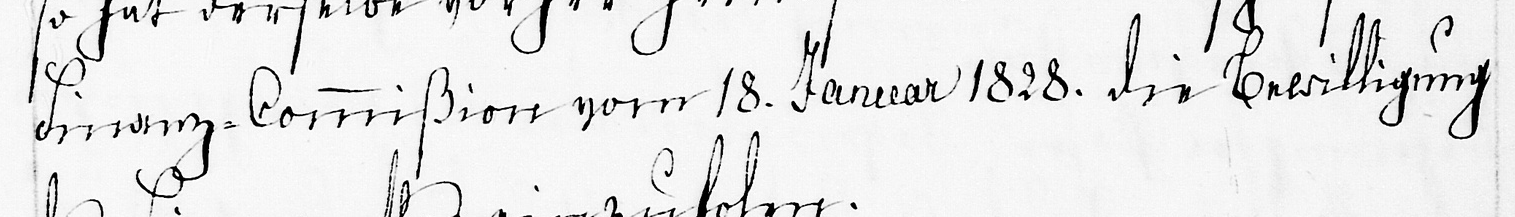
Finanz-Commißon vom 18. Januar 1828. die Bewilligung
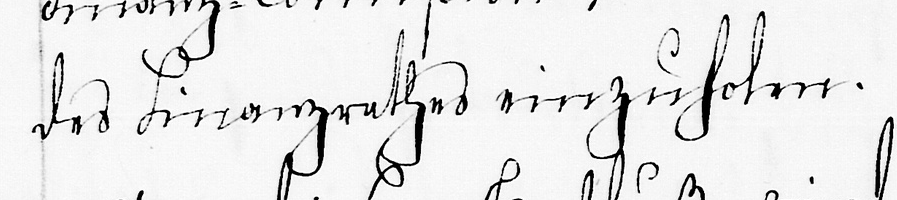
des Finanzrathes einzuholen.
